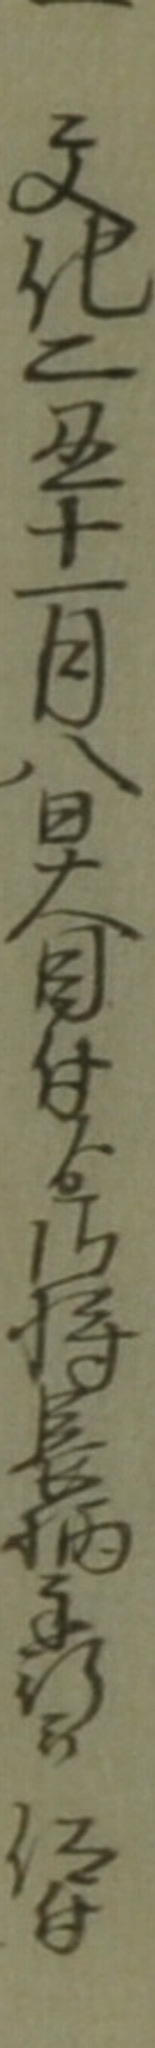一文化二丑十一月八日大目付ゟ御長柄奉行被仰付
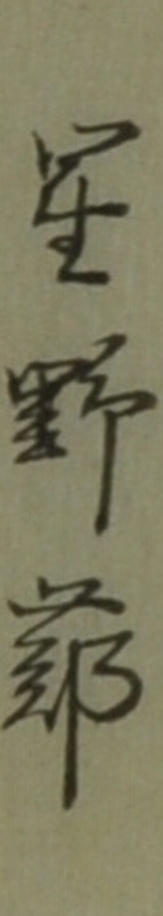星野蔀

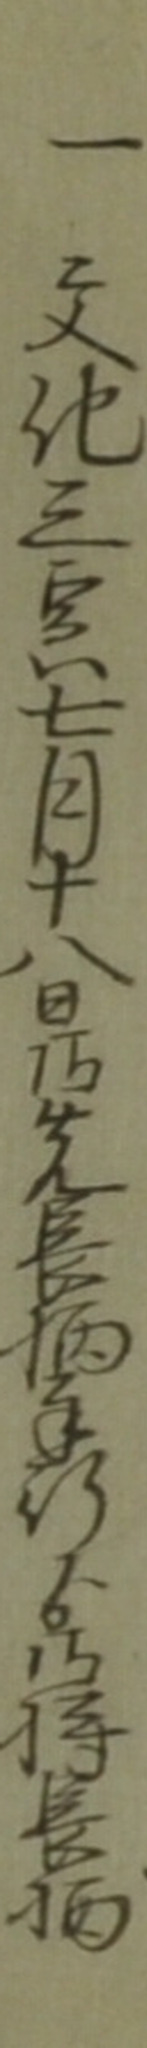一文化三寅七月十八日御先長柄奉行ゟ御持長柄
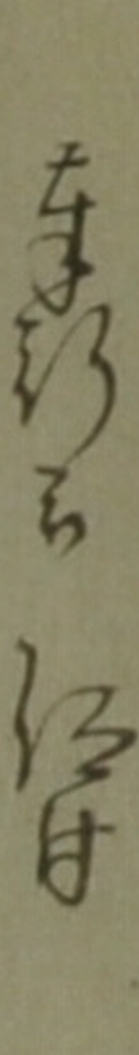奉行被仰付
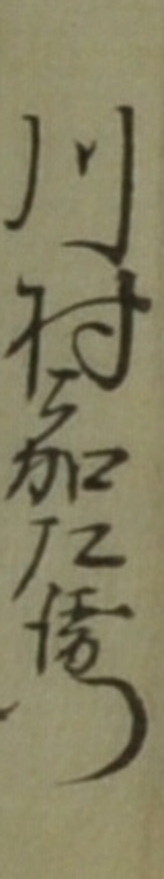川村嘉左衛門
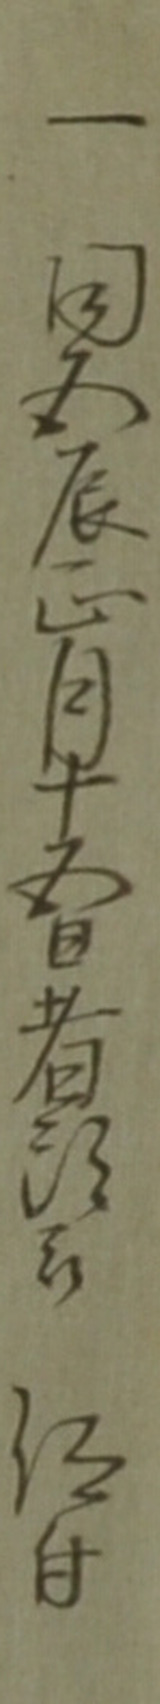一同五辰正月十五日者頭被仰付
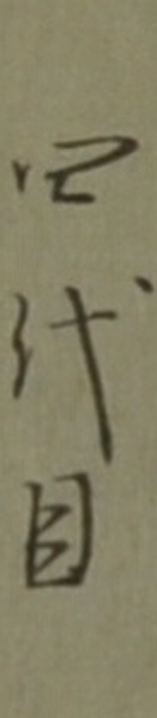四代目
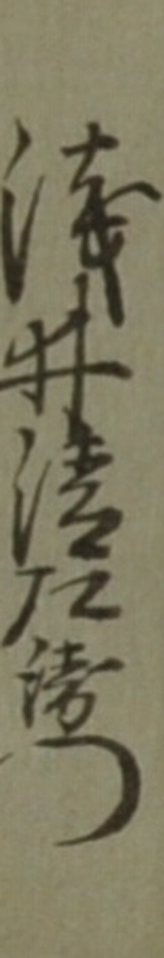浅井清左衛門
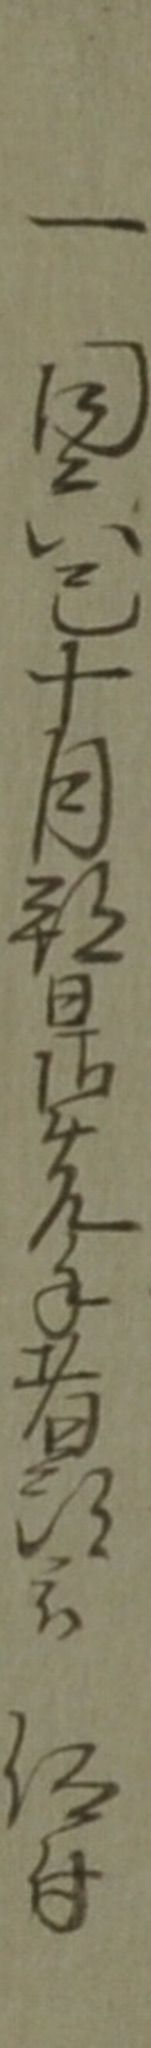一同六巳十月朔日御先手者頭被仰付
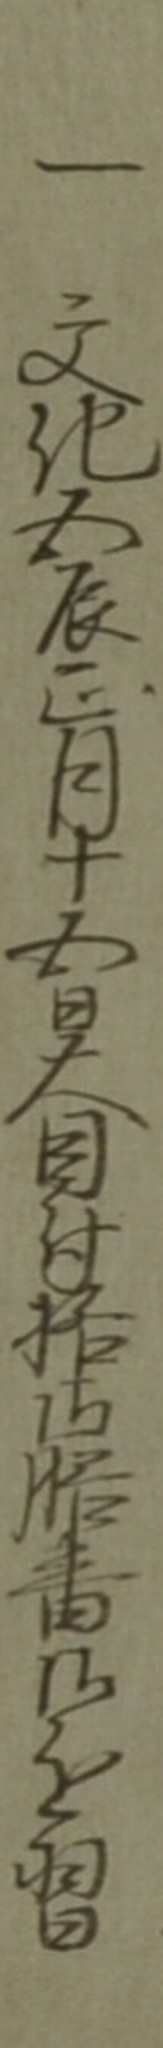一文化五辰正月十五日御目付格御膳番御近習
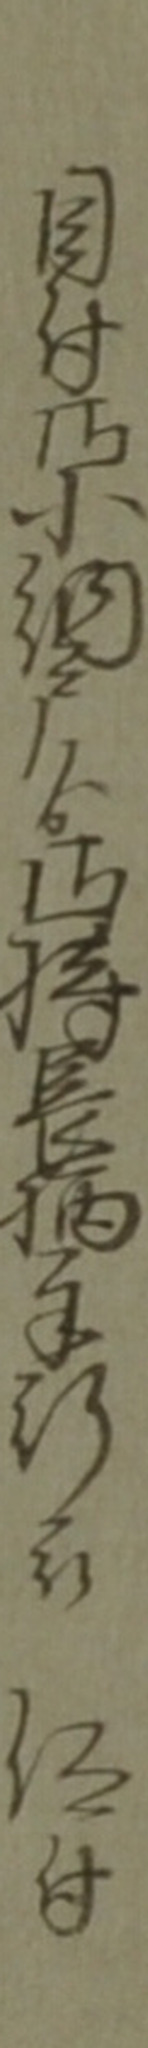目付御小納戸ゟ御持長柄奉行被仰付
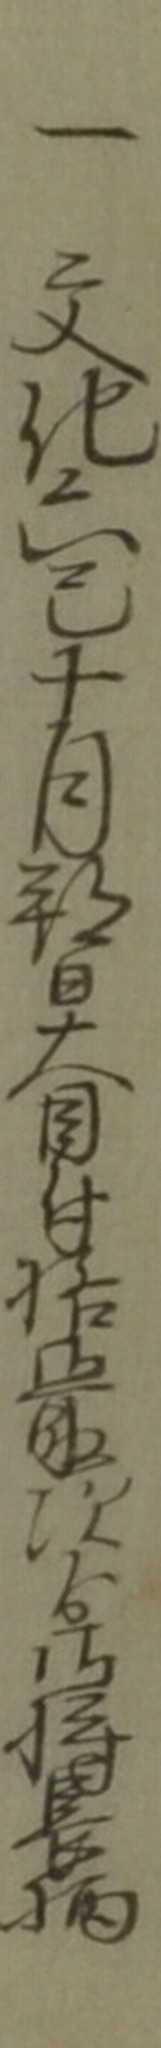一文化六巳十月朔日大目付格御取次ゟ御持長柄
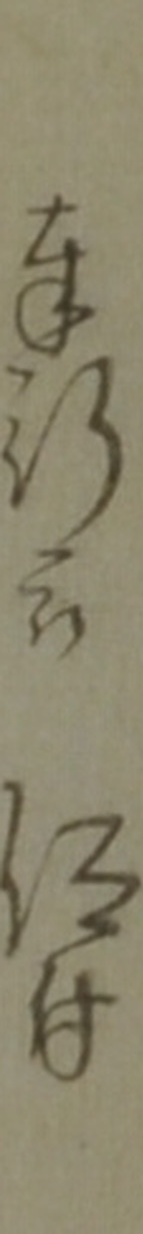奉行被仰付
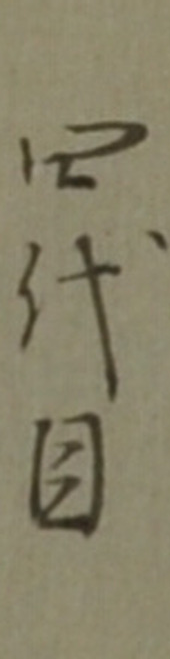四代目
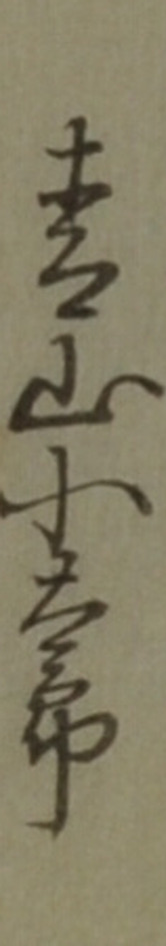青山小太郎
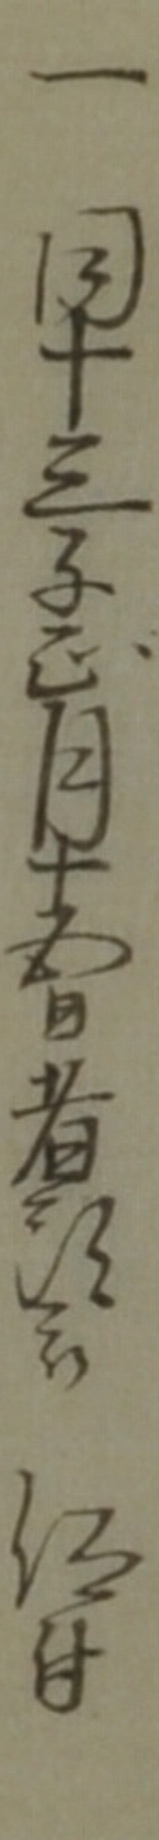一同十三子正月十五日者頭被仰付
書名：諸御役代々録（三）
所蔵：伊那市立高遠町図書館・合同会社AMANE
